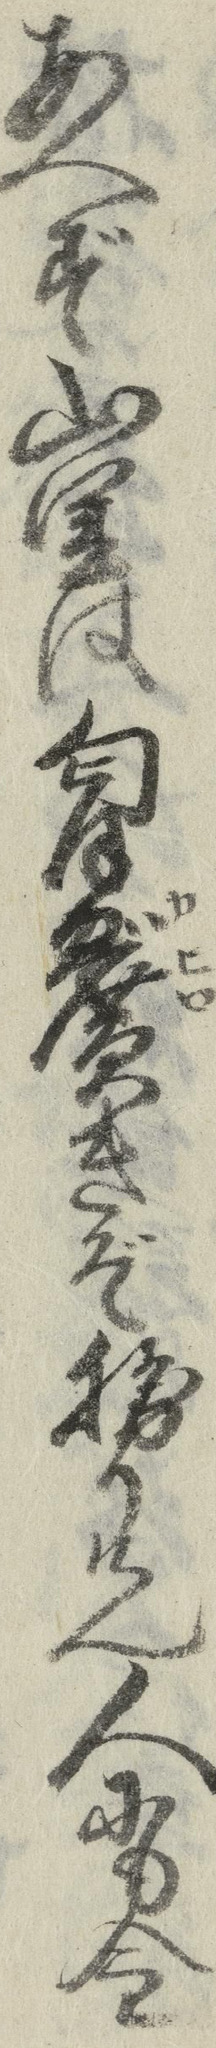あへず山里は胸が廣きぞ勝りけん人にも金
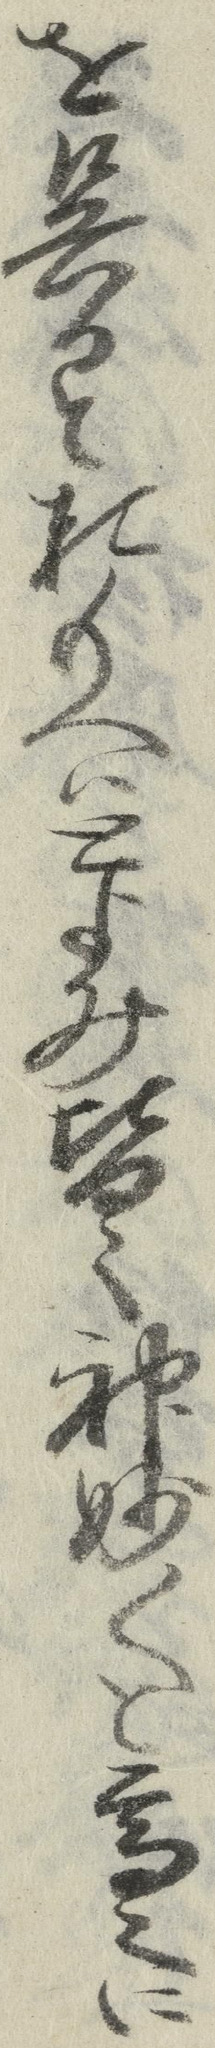を呉るとおもへはとよみ皆々神妙〳〵と高々に
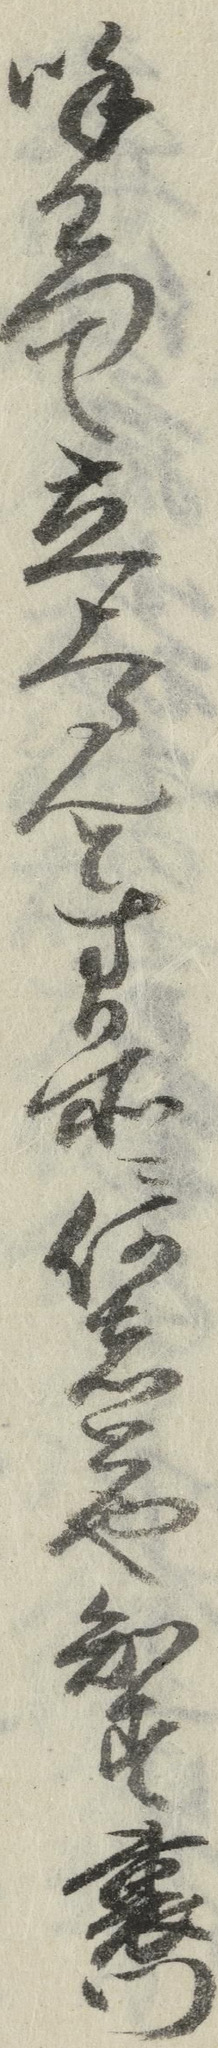呼わつて立上らんとする所に何者とや知す裏門
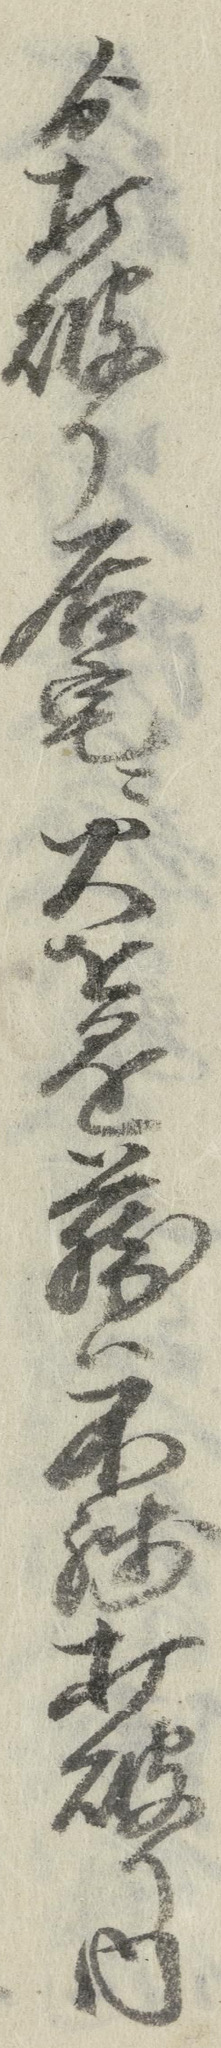ゟ打破り居宅に火を懸蔵は不残打破り内
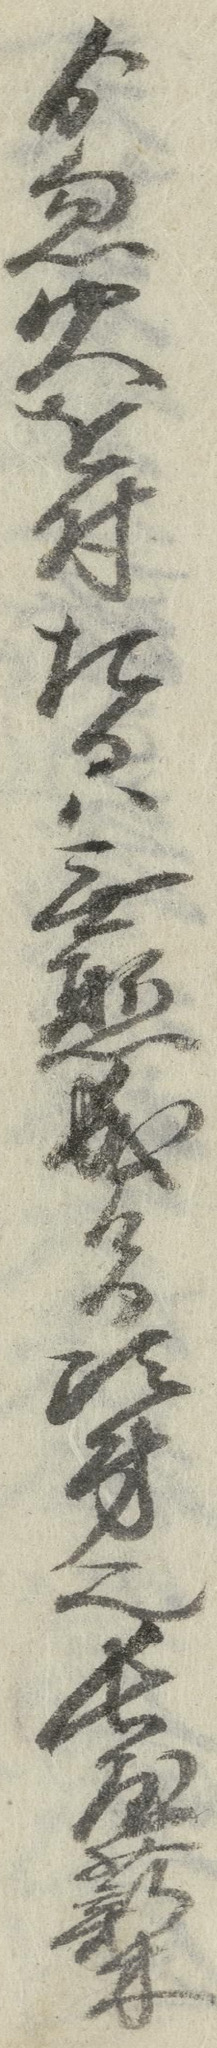ゟ忽火を付たるは無慙成ける次第也長屋薪木
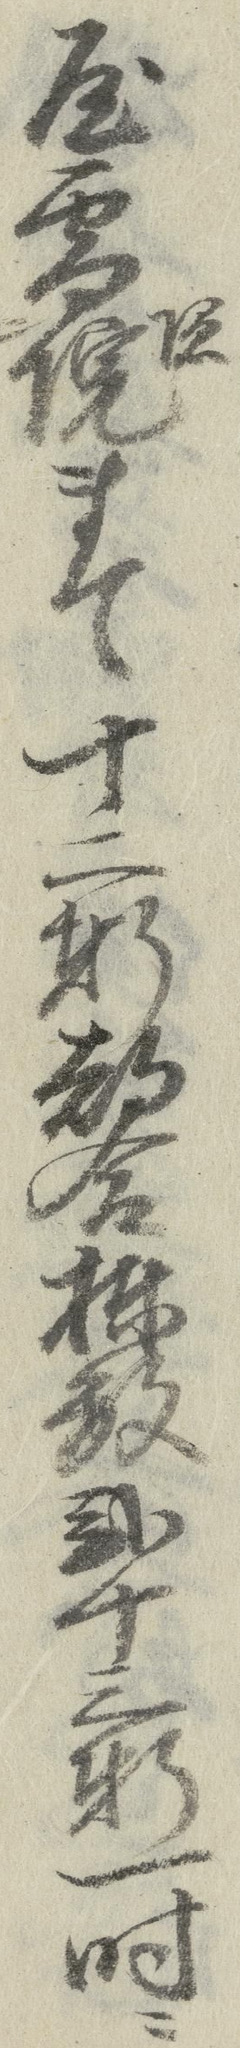屋雪隠俒まて十二軒都合棟数弐十三軒一時に

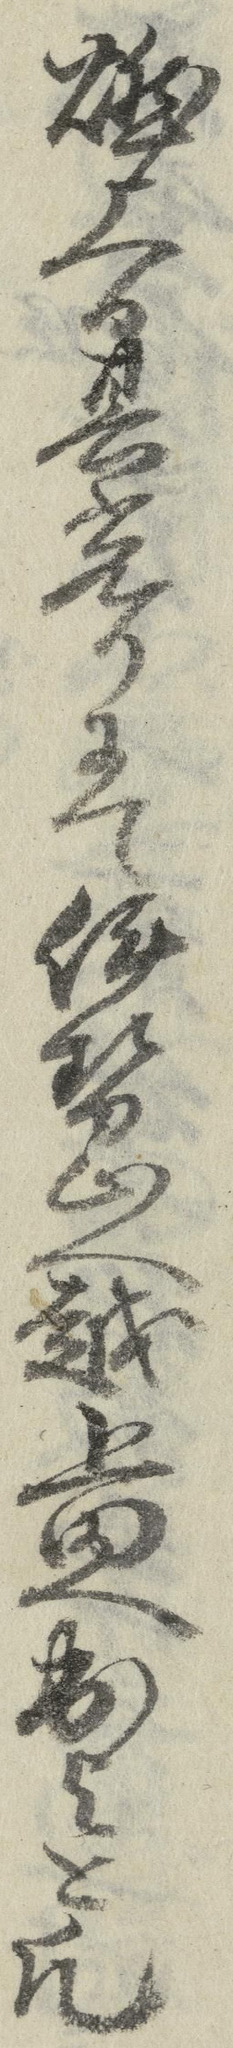燃上る其光りにて伊勢山へ越上田へ出よと凡
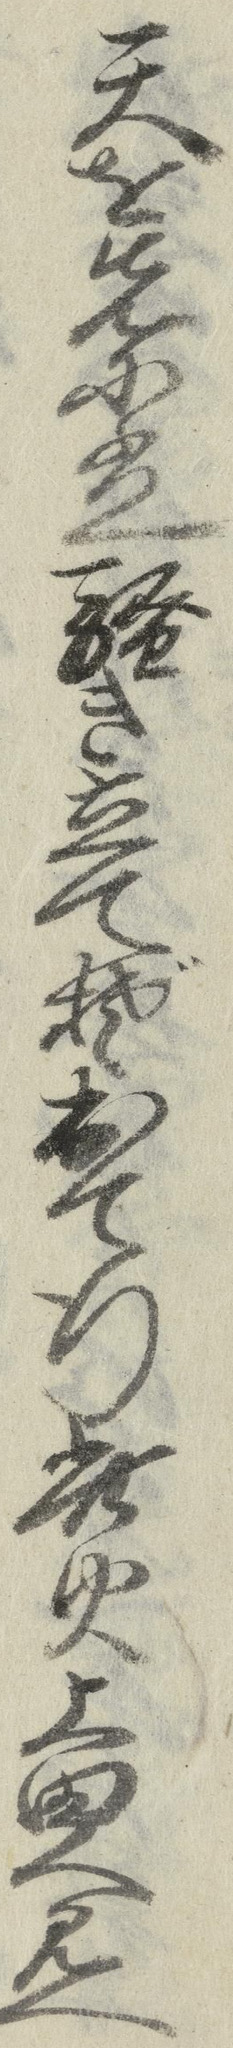天を先に立騒き立てぞ出て行此火上田へ見へ
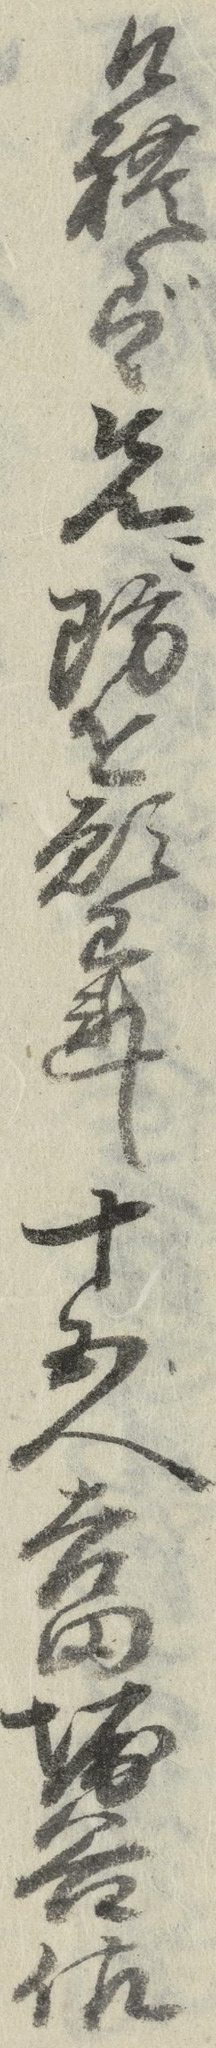候程ぞ先に防を願われし十五人吉田堀谷佐
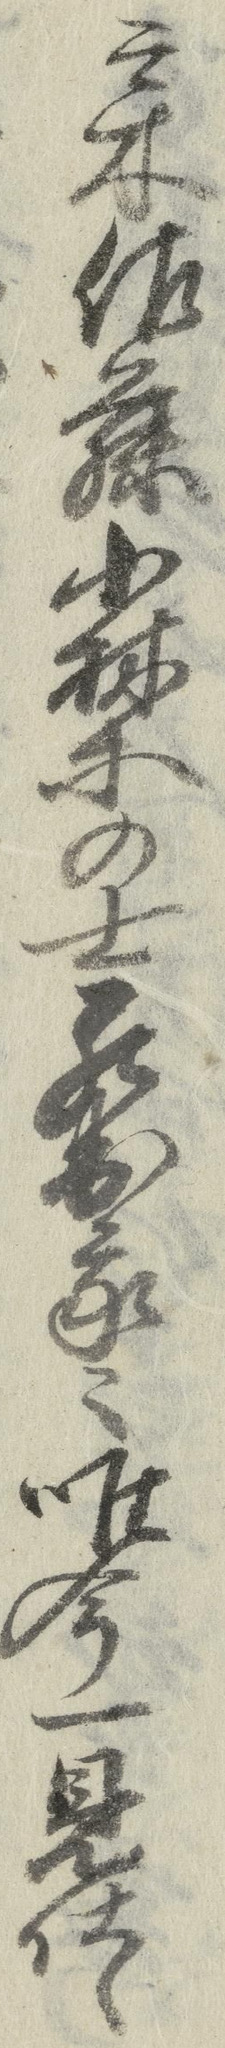々木佐藤小林等の士罷出我々唯今一見仕候
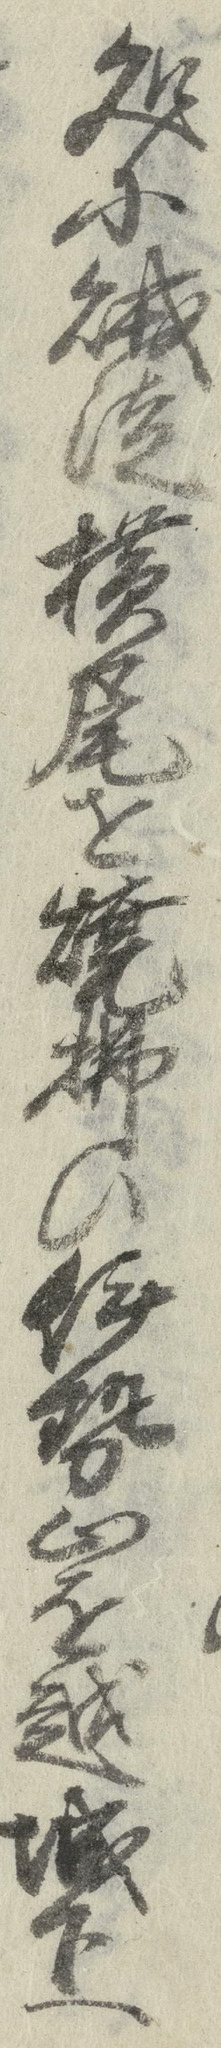処に賊徒横尾を焼拂ひ伊勢山を越城下へ
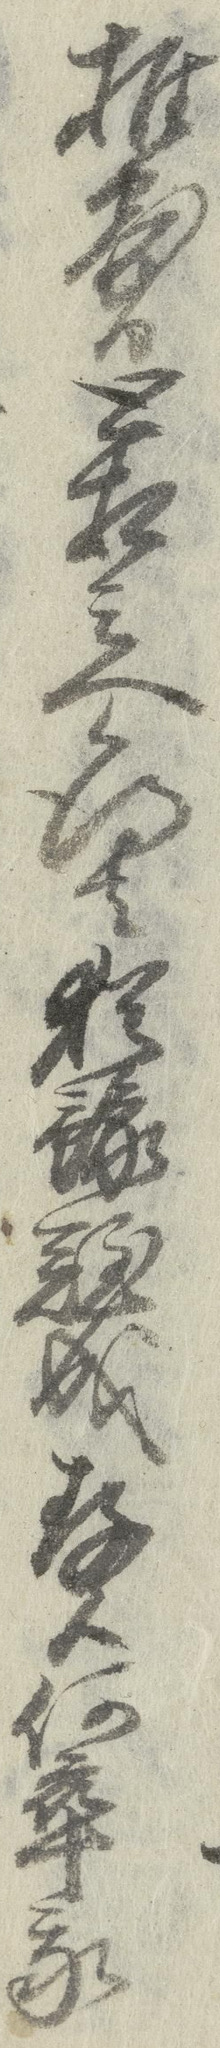推寄ると相みへ候得は猶予難成存候何卒我
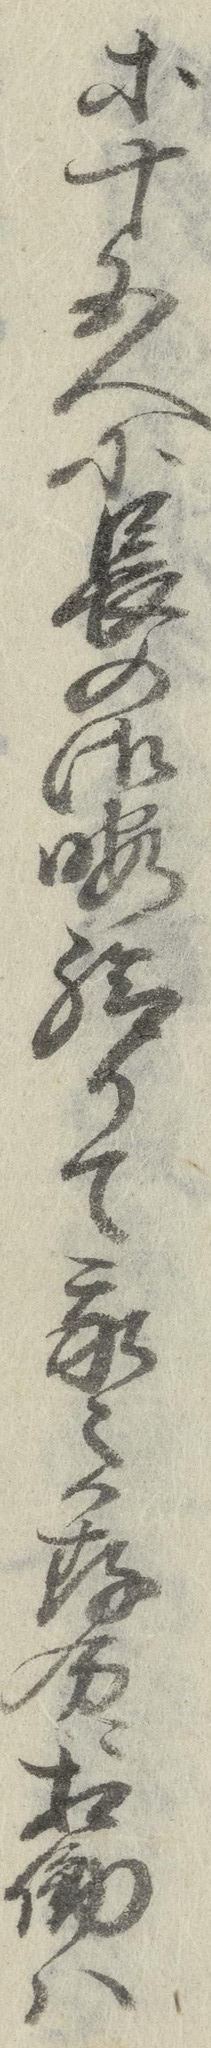等十五人に長の御暇給りて我々か存分に相働は
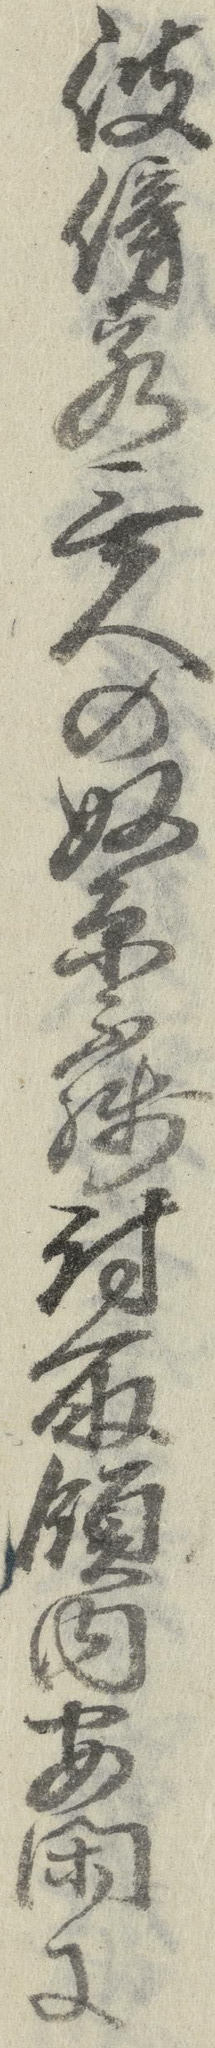彼傍若無人の奴原不残討取領内安閑に
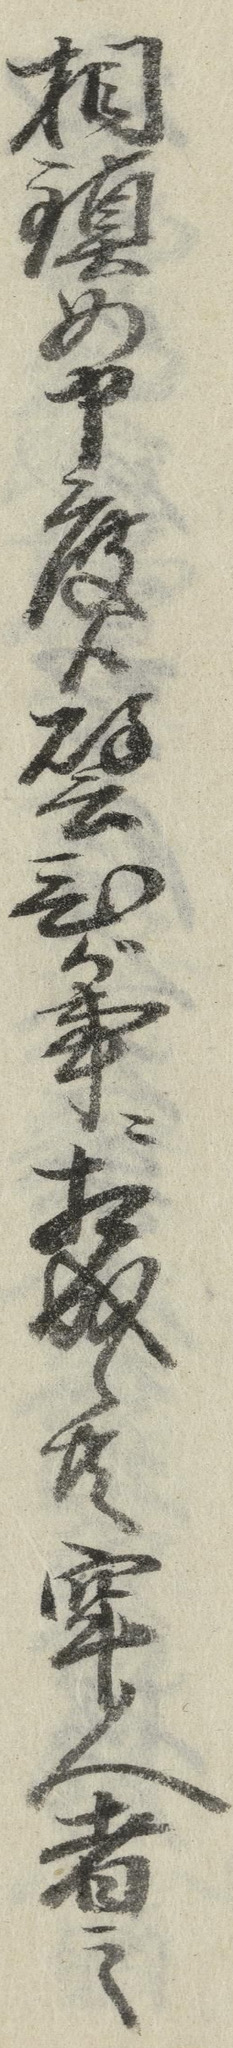相鎮め申度候譬ひが事に相成候共牢人者之
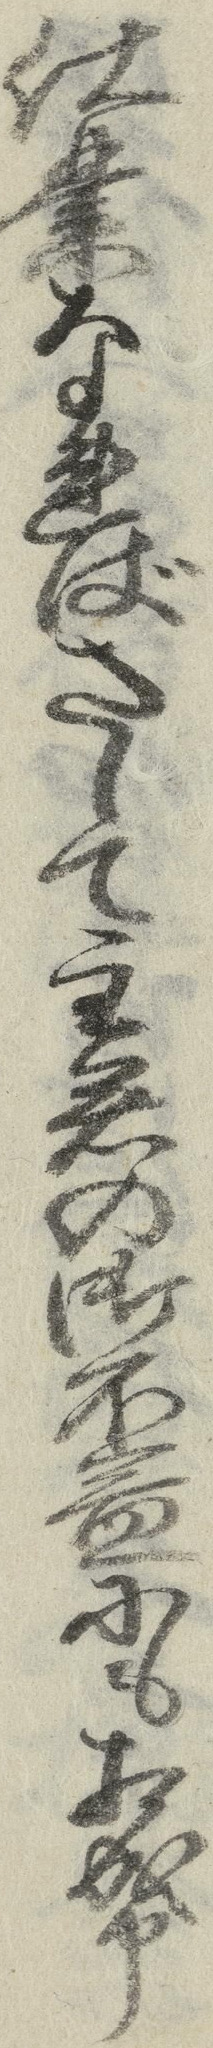仕業なればさして主君の御不益にも相成申
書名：浅間大焼騒動記　下
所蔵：東京大学地震研究所図書室 Earthquake Research Institute Library, The University of Tokyo, JAPAN
